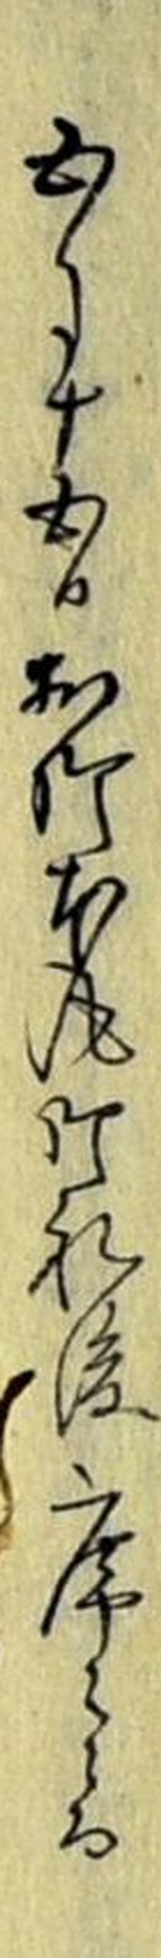五月十五日於御本丸御礼後席々に而

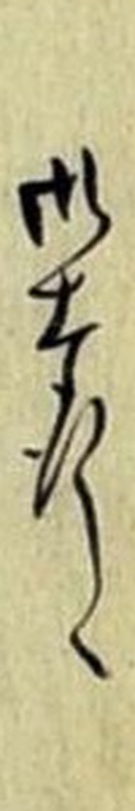御奉行へ
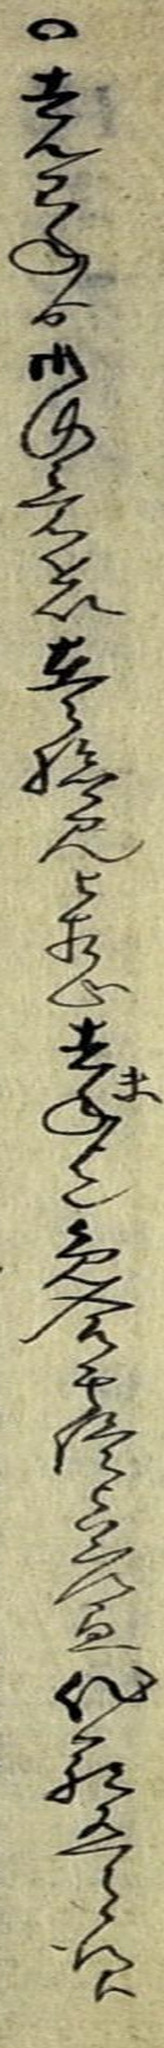○去ル巳年ゟ御趣意を以在々検見被相止去未年迄免合其侭被差置作難有之候得は
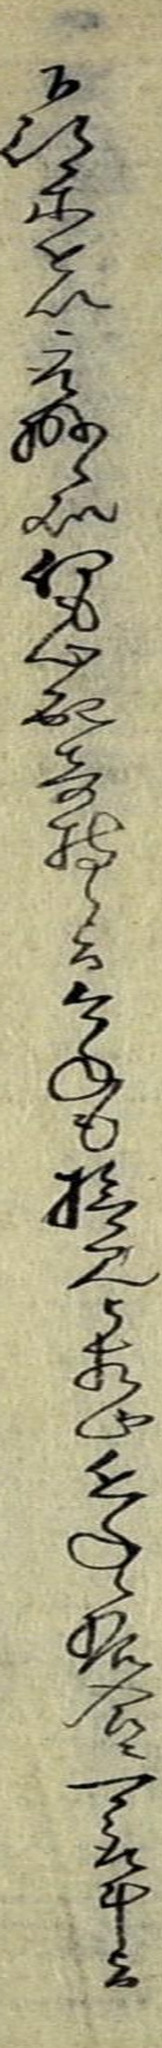下行米を以取扱候処何も心配奇特之旨今年も検見被相止近年之振合に可被取斗旨
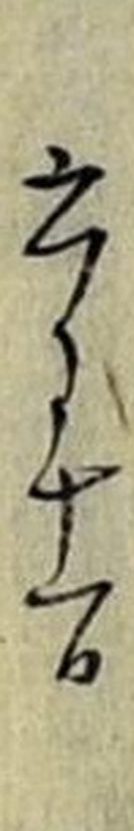六月十一日
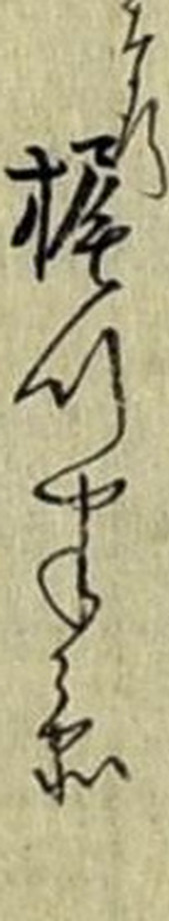梶川半兵衛
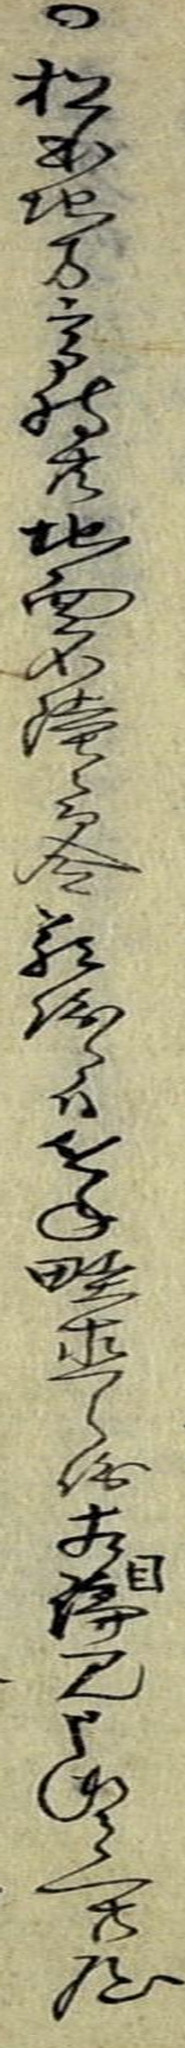○松本地方高持共地面不障候而令難儀候に付近年畔直し儀相目論見申趣に候へ共屋
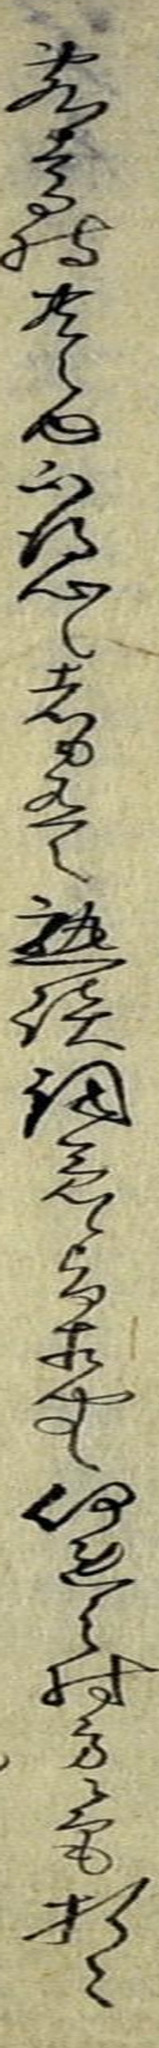敷高持共之内不心得之者も有之熟談調兼候旨相聞候何連之村方に而も折々
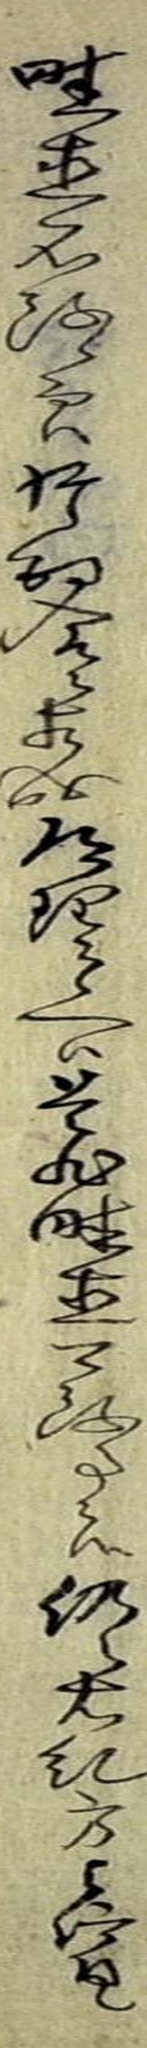畔直不致候而は片釣合に相成道理に候へは是非畔直可致事に候仍之右糺方被仰付候
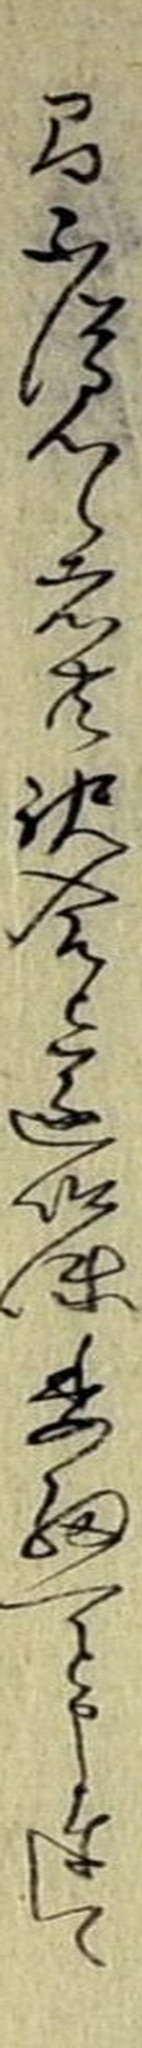間不得心之者共訳合被遂吟味委細可被申達候
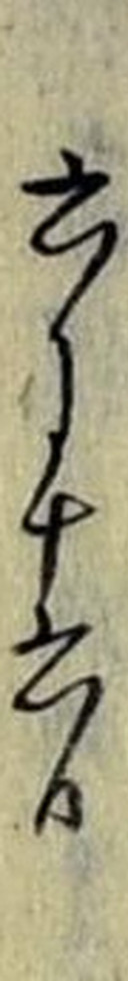六月十六日
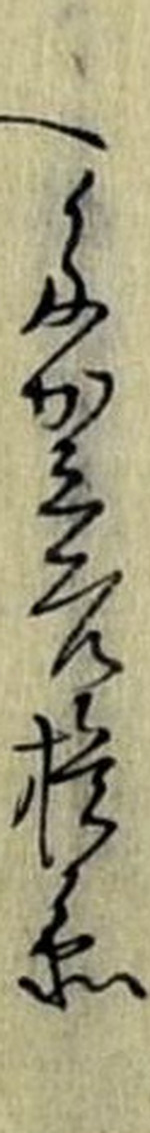多賀谷権兵衛
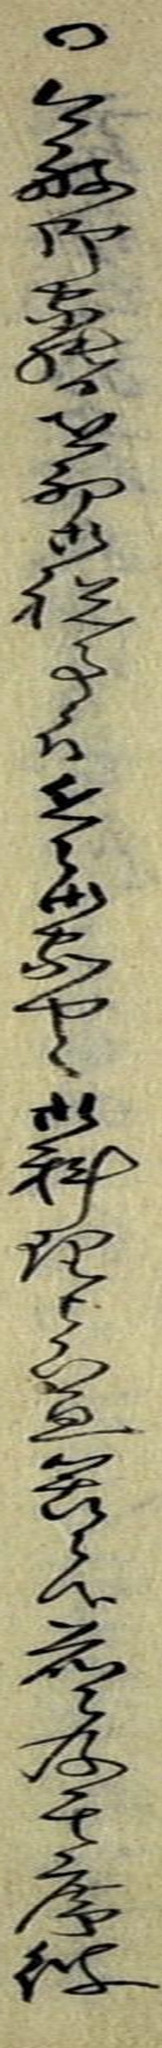○今般御家督を初御祝事に付近々御家中へ御料理被下置筈ニ候前々及其席彼
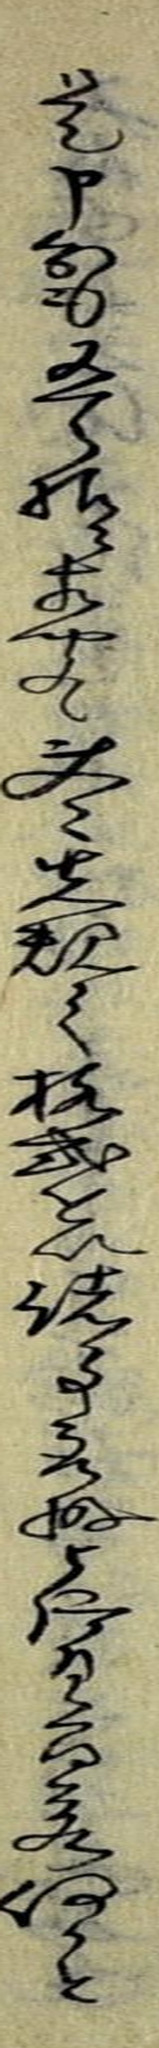是申分も有之様に相聞候夫々先規之格式を以諸事取扱被仰付候間若何かと
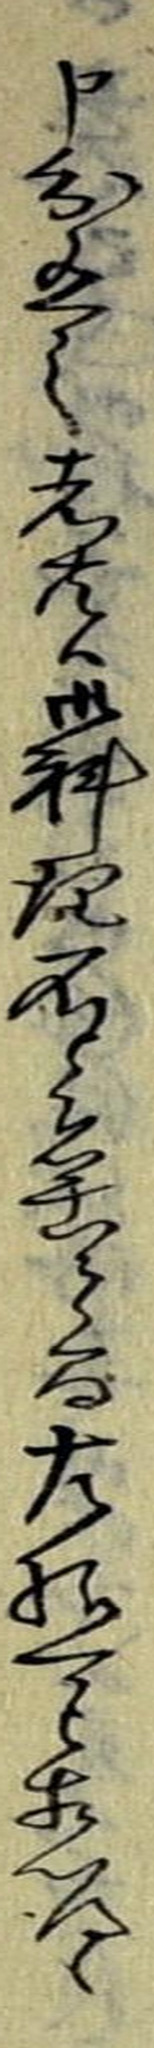申分有之者共は御料理不被下筈に候間左様可被相心得候
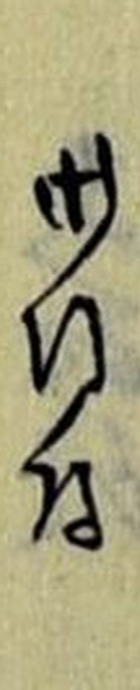御目付
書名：命令之部 四
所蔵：福井県文書館 Fukui Prefectural Archives
